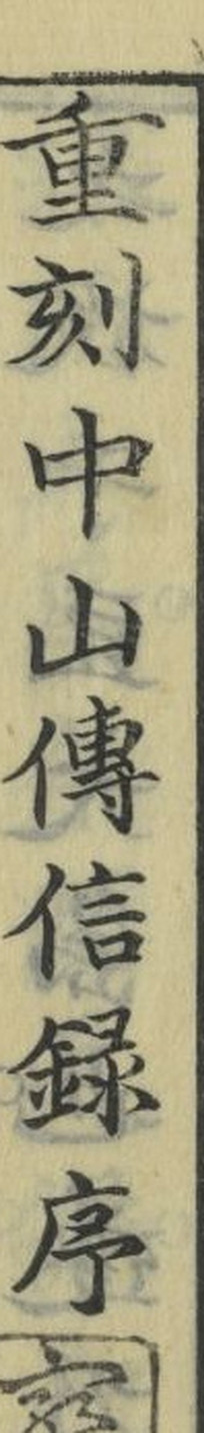重刻中山傳信録序
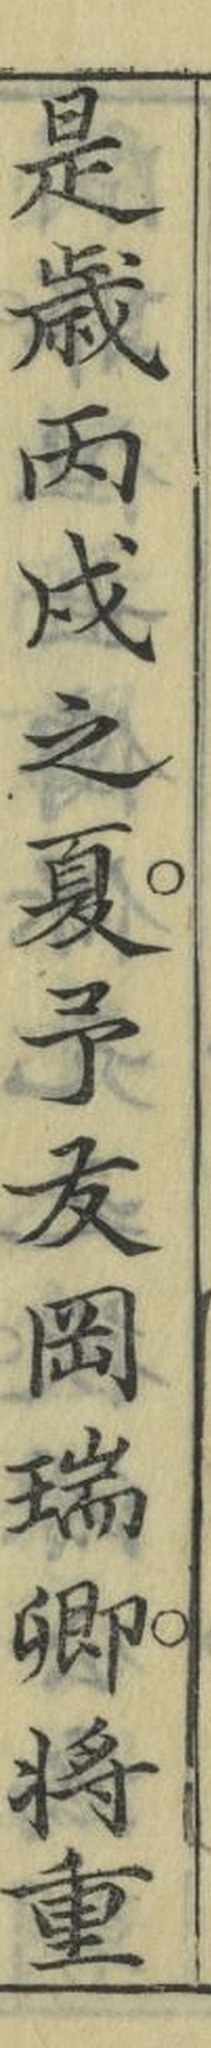是歳丙戌之夏。予友岡瑞卿将重
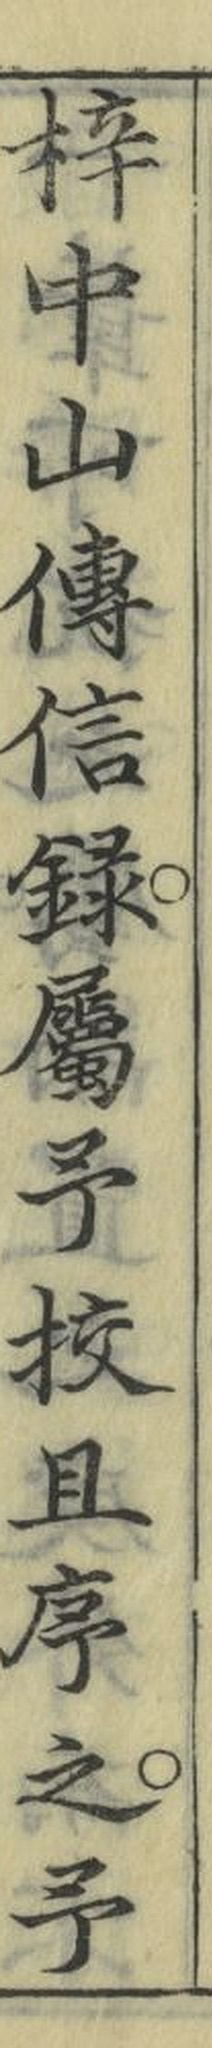梓中山傳信録。屬予挍且序之。予
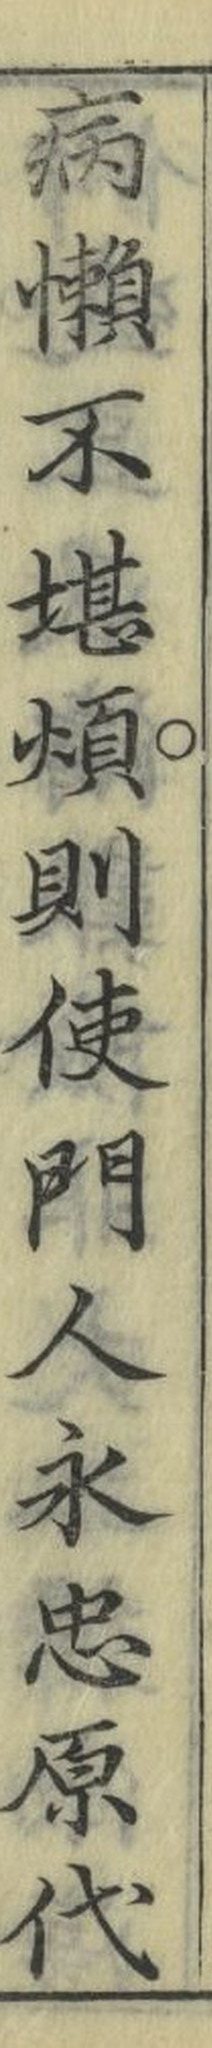病懶不堪煩。則使門人永忠原代
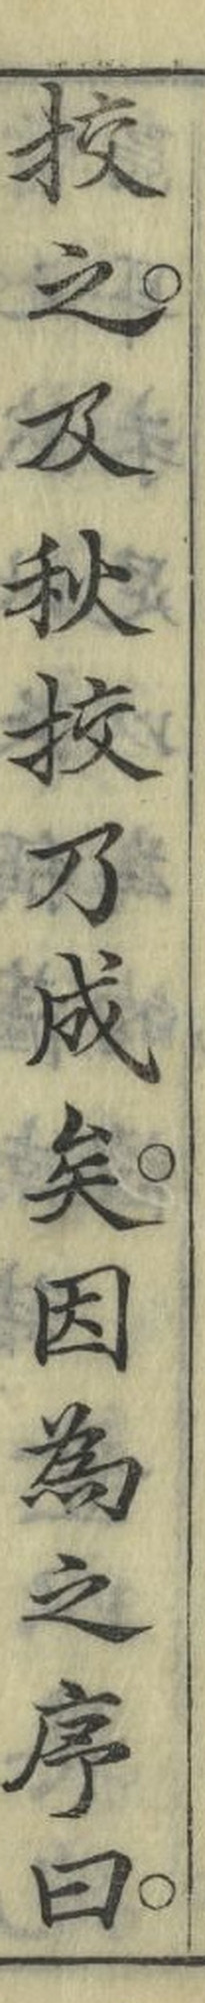挍之。及秋挍乃成矣。因為之序曰。
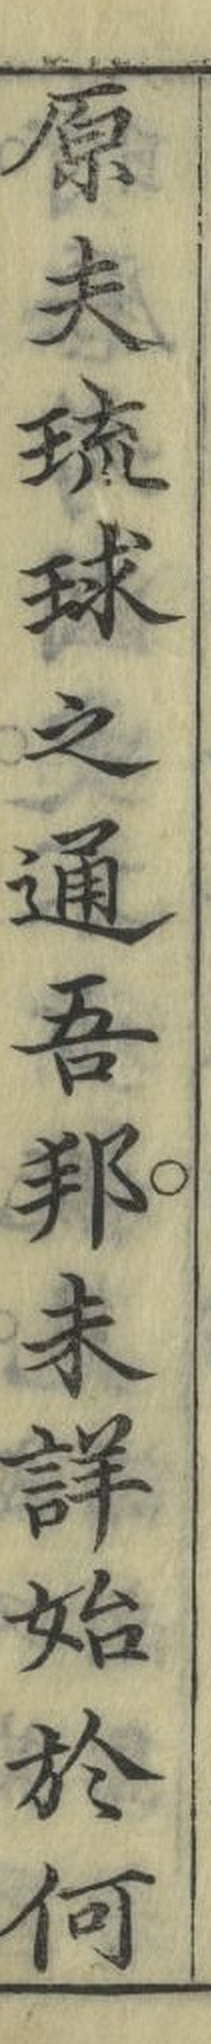原夫琉球之通吾邦。未詳始於何

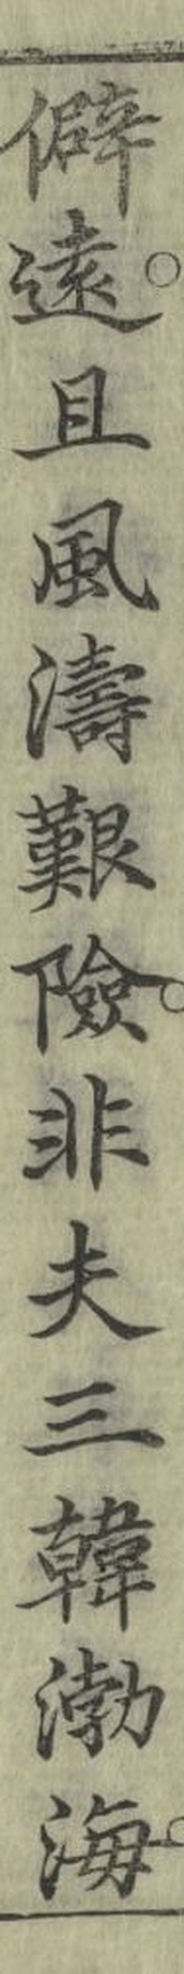僻逺。且風濤艱險。非夫三韓渤海。
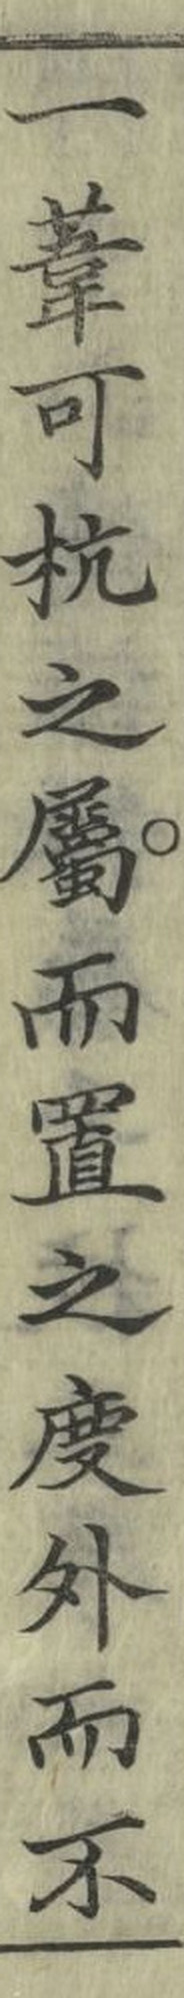一葦可杭之屬。而置之度外而不
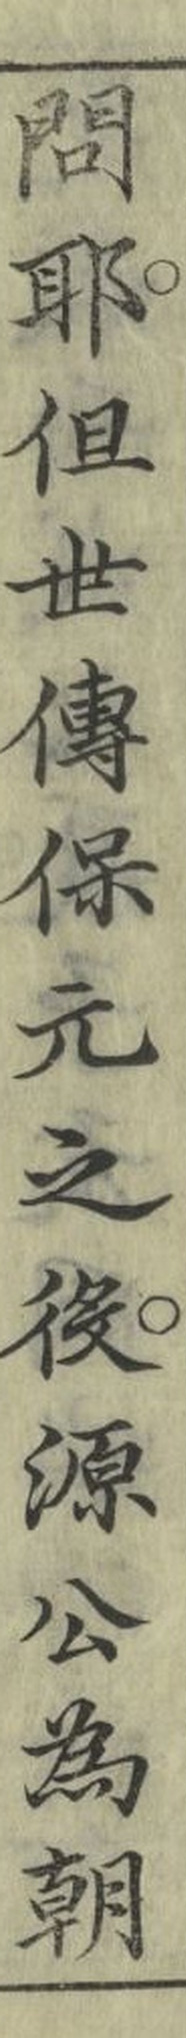問耶。但世傳保元之役。源公為朝
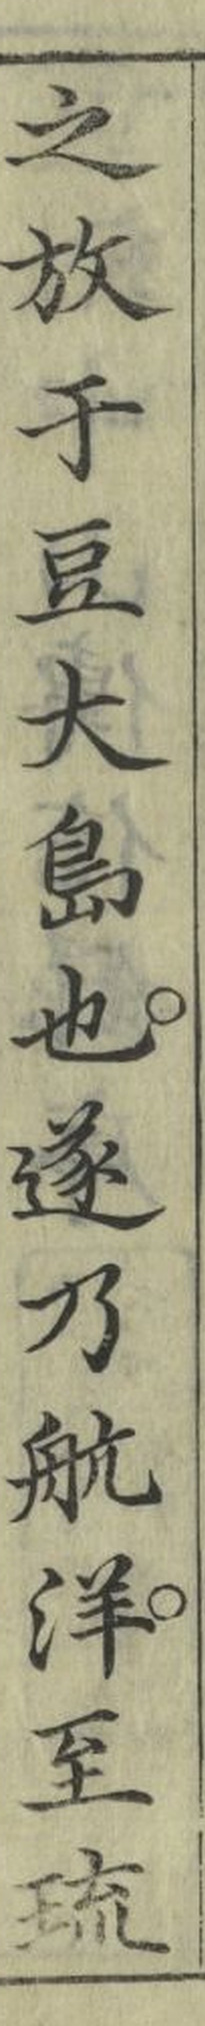之放于豆大島也。遂乃航洋。至琉
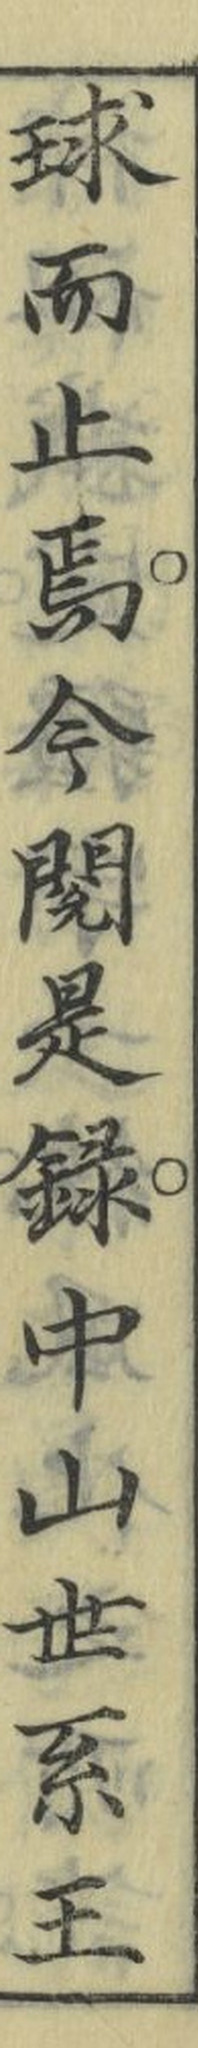球而止焉。今閱是録。中山世系王
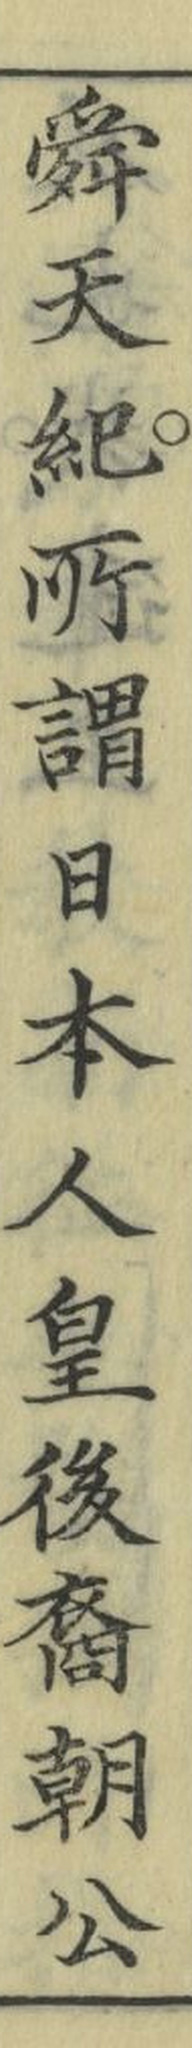舜天紀。所謂日本人皇後裔朝公
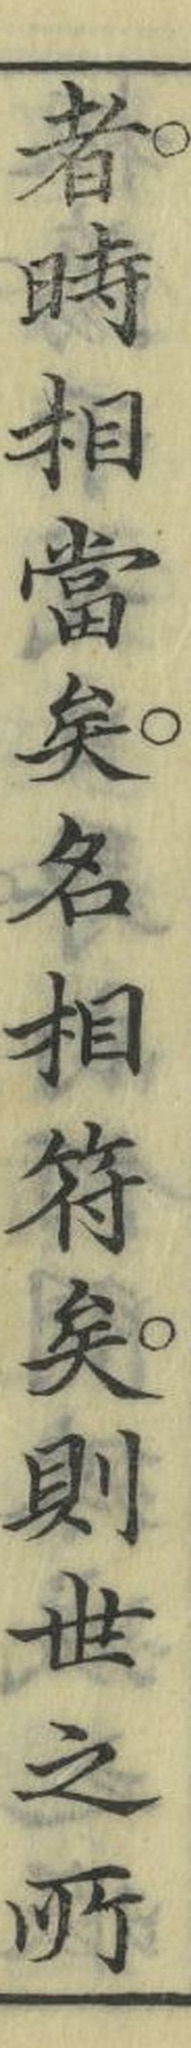者。時相當矣。名相符矣。則世之所
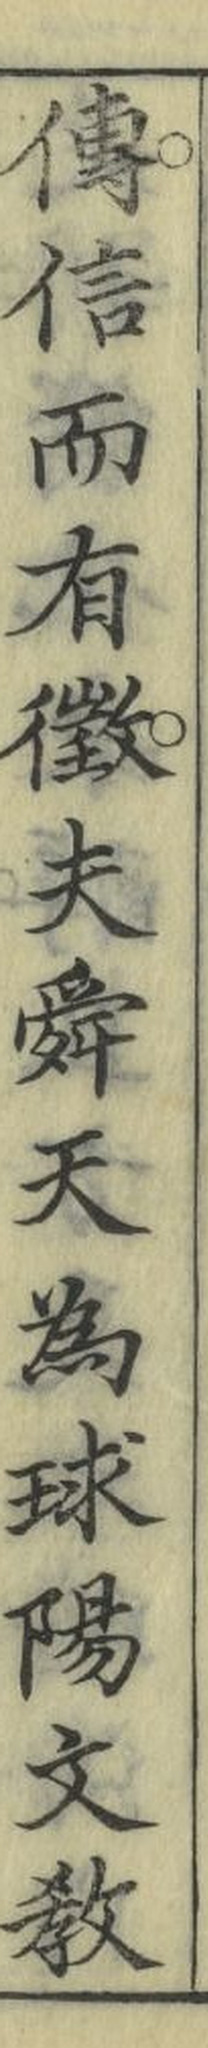傳。信而有徵。夫舜天為球陽文敎
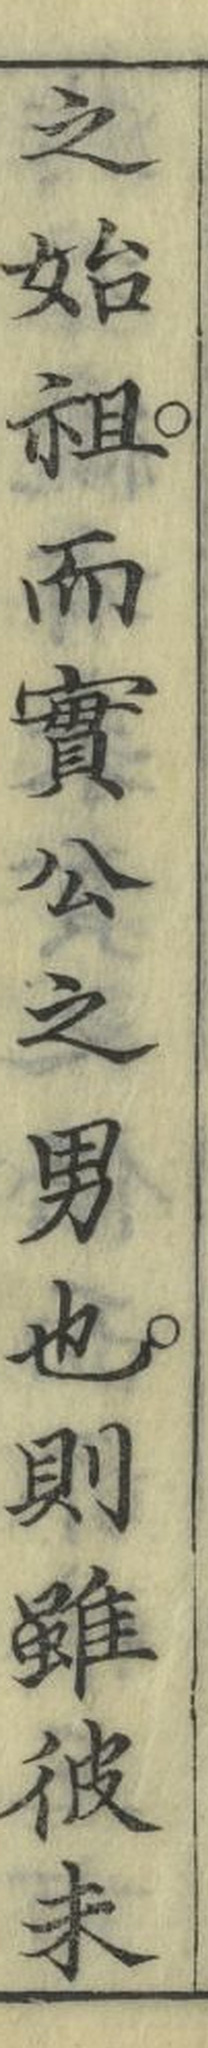之始祖。而實公之男也。則雖彼未
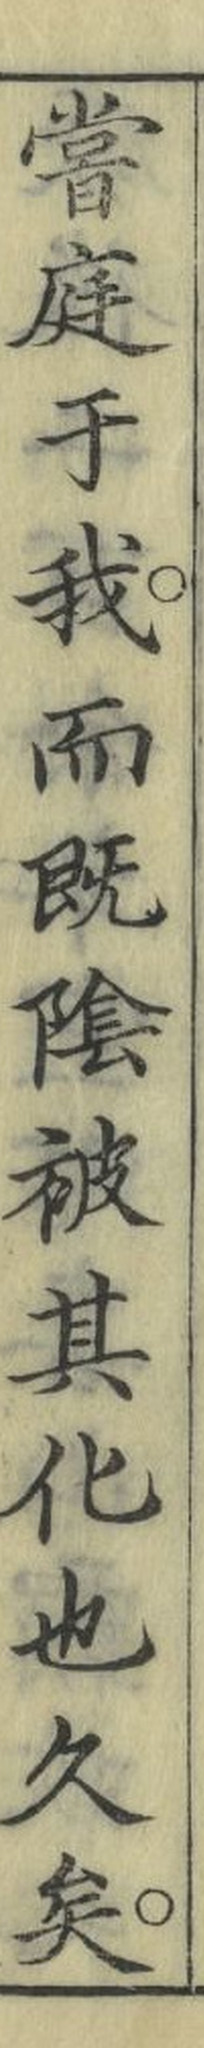嘗庭于我。而既隂被其化也久矣。
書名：中山伝信録 巻一
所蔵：University of the Ryukyus Library
